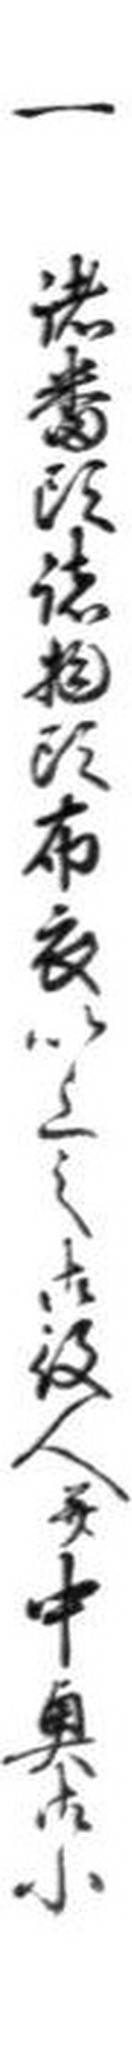一諸番頭諸物頭布衣以上之御役人并中奥御小
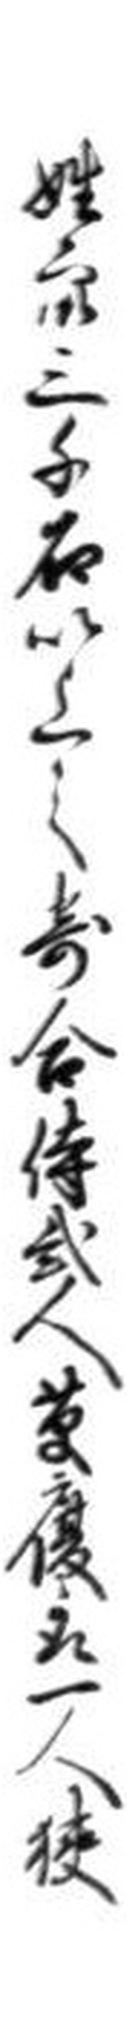姓衆三千石以上之寄合侍弐人草履一人挟
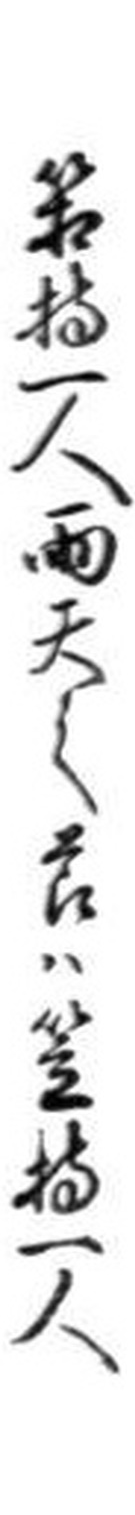箱持一人雨天之節ハ笠持一人
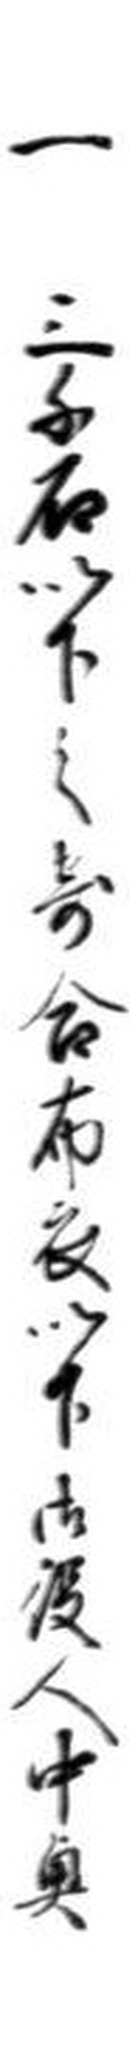一三千石以下之寄合布衣以下御役人中奥
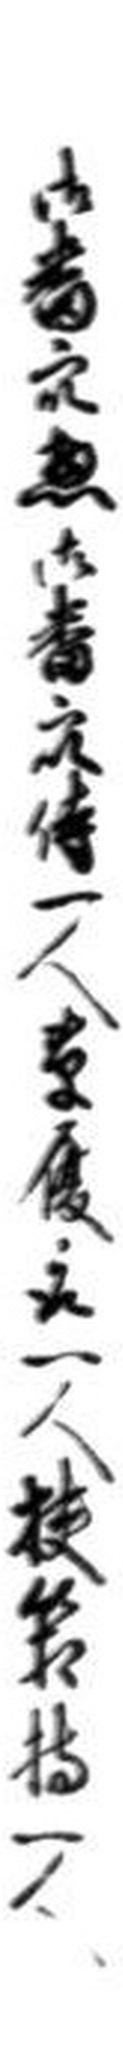御番衆惣御番衆侍一人草履取一人挟箱持一人
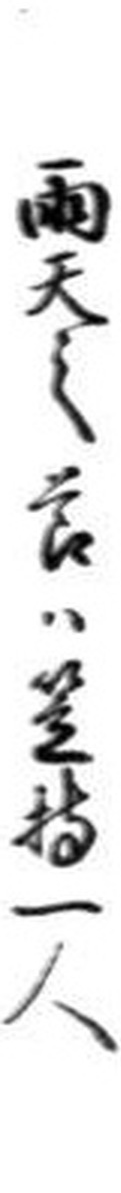一人雨天之節ハ笠持一人
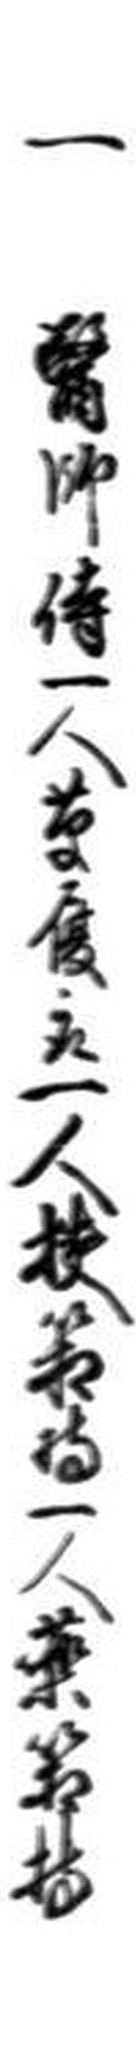一医師侍一人草履取一人挟箱持一人薬箱持
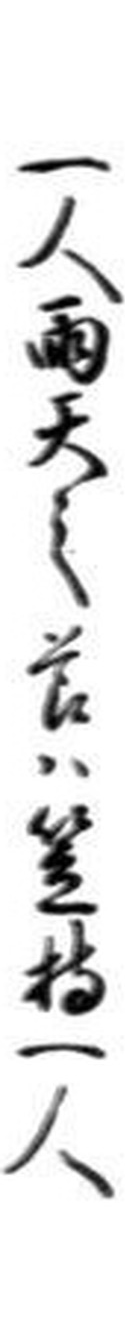一人雨天之節ハ笠持一人
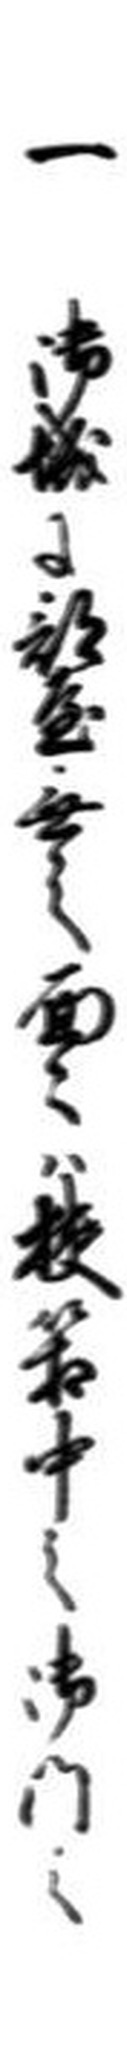一御城に部屋無之面々ハ挟箱中之御門之
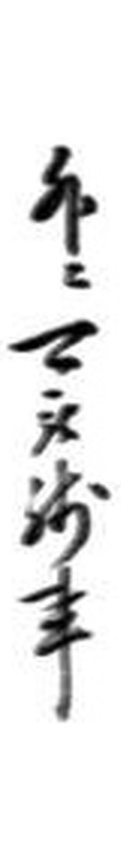外ニ可被残事
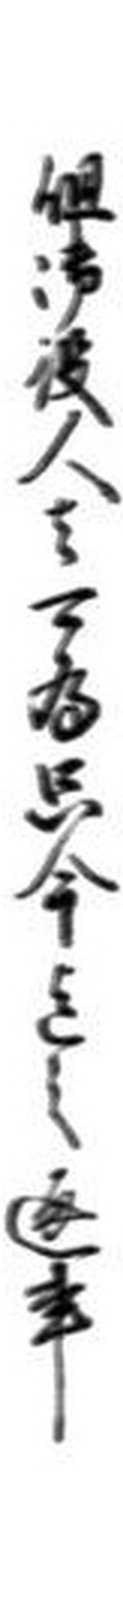但御役人者可為只今迄之通事
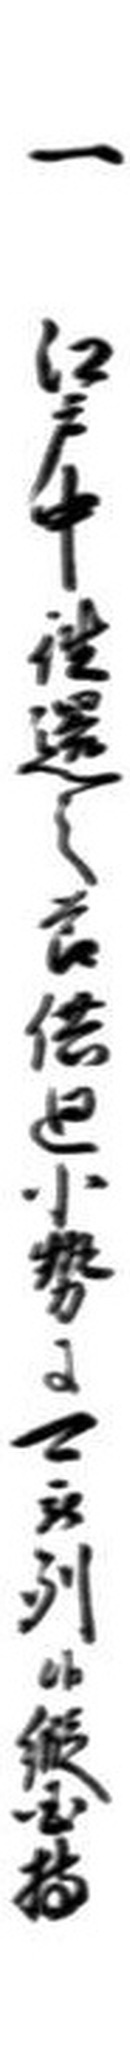一江戸中往還之節供廻小勢に可被列候縦国持
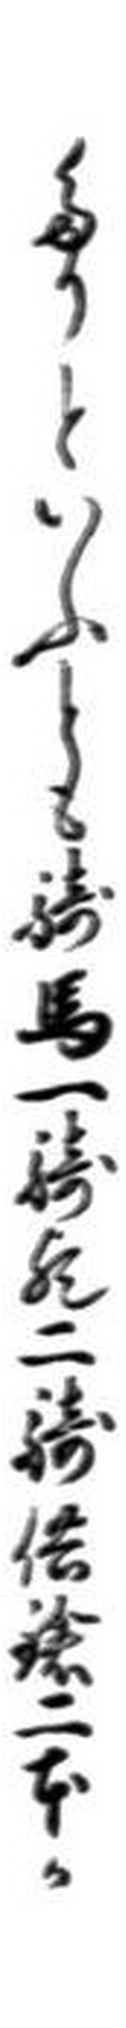たりといふとも騎馬一騎歟二騎供鎗二本か
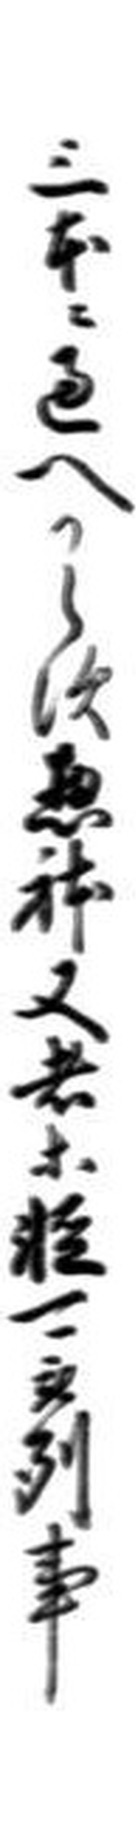三本ニ過へからす惣体又者等軽可被列事

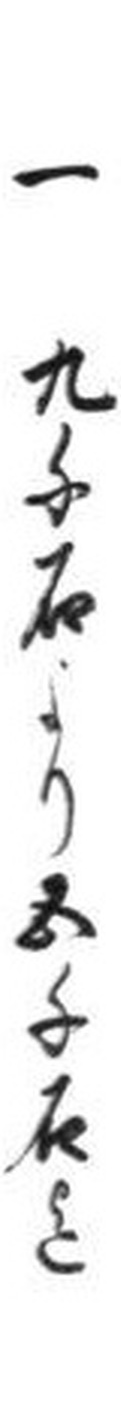一九千石より五千石迄
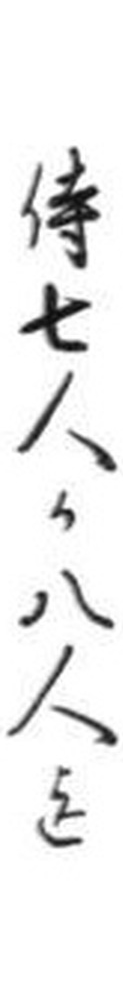侍七人か八人迄
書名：家譜 三十二 吉邦公 従享保二年到享保三年
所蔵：福井県文書館 Fukui Prefectural Archives
